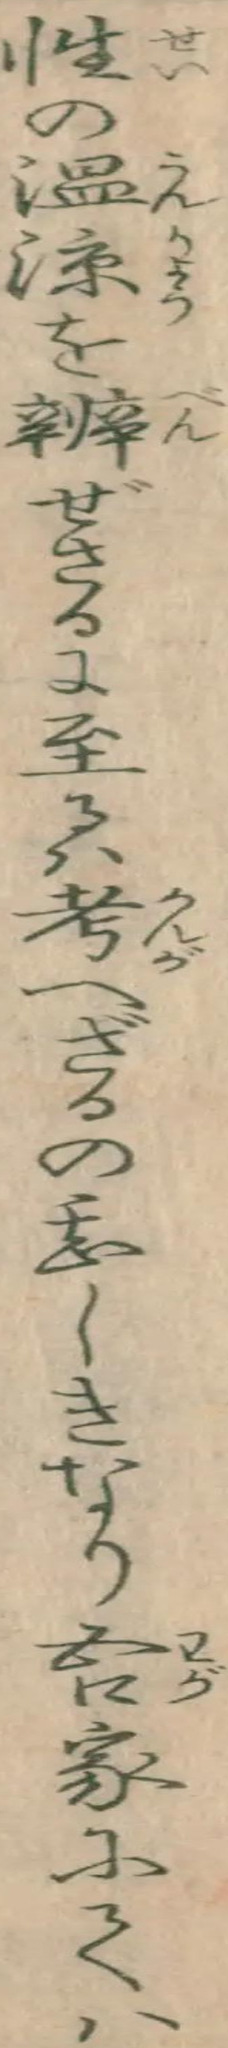性の温涼を辨ぜさるに至るは考ひえざるの甚しきなり吾家にては
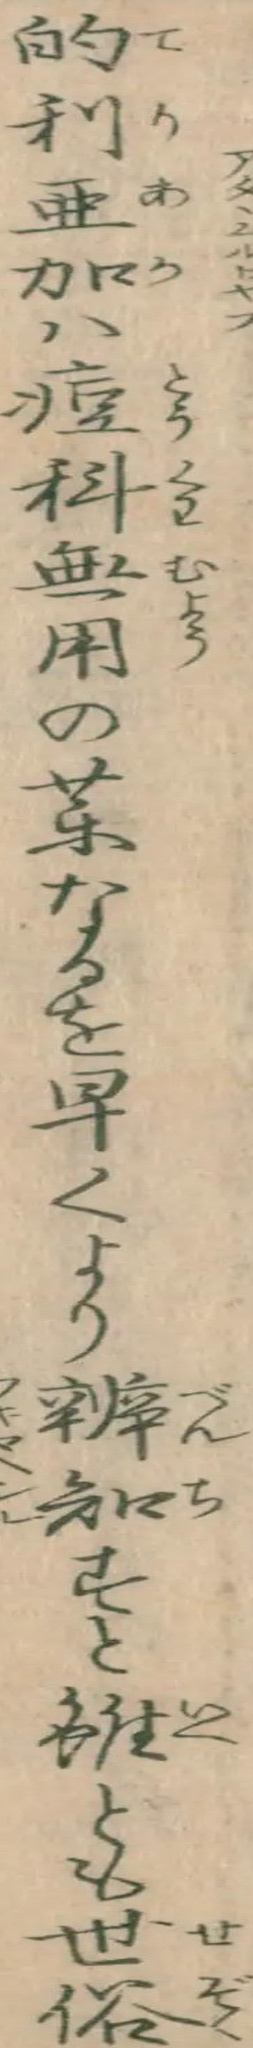的利亜加は痘科無用の薬なるを早くより辨知すと雖とも世俗
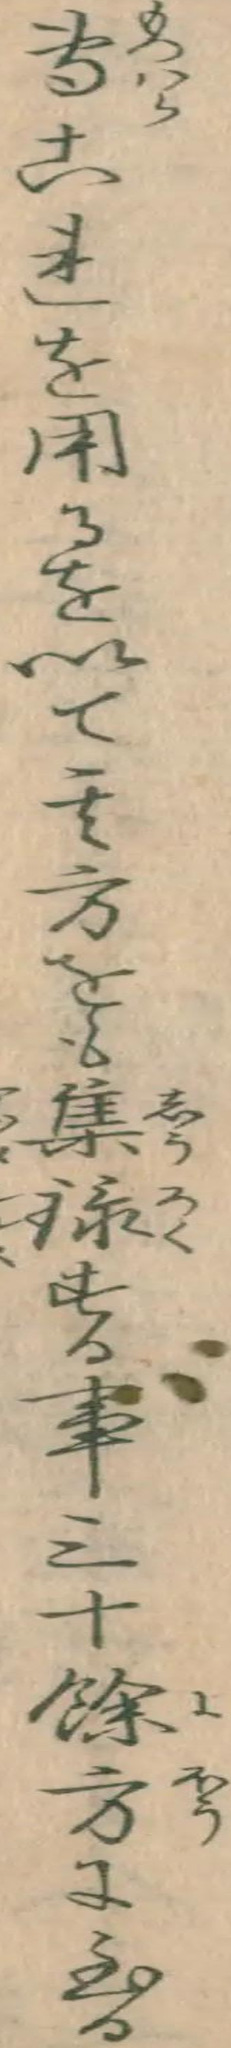専これを用るを以て其方をも集録する事三十餘方に至る
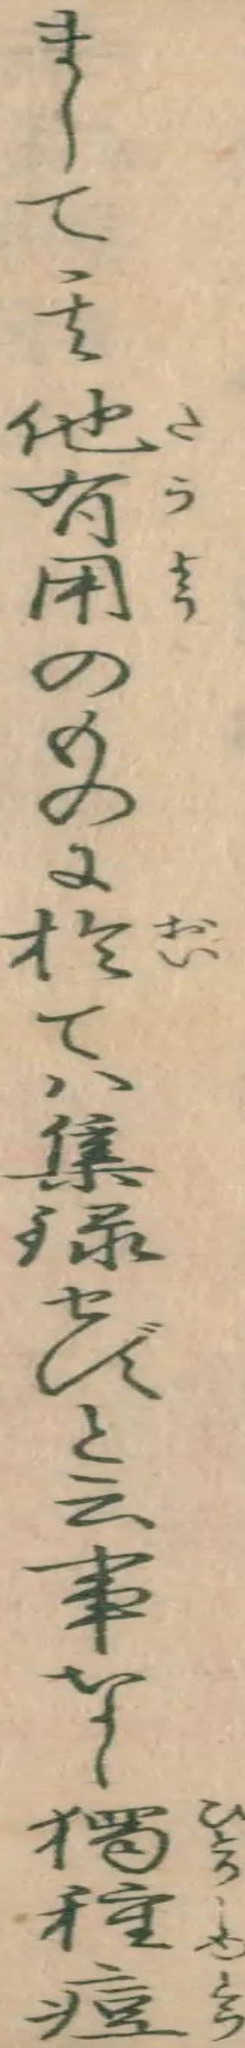まして其他有用のものに於ては集録せずと云事なし獨種痘
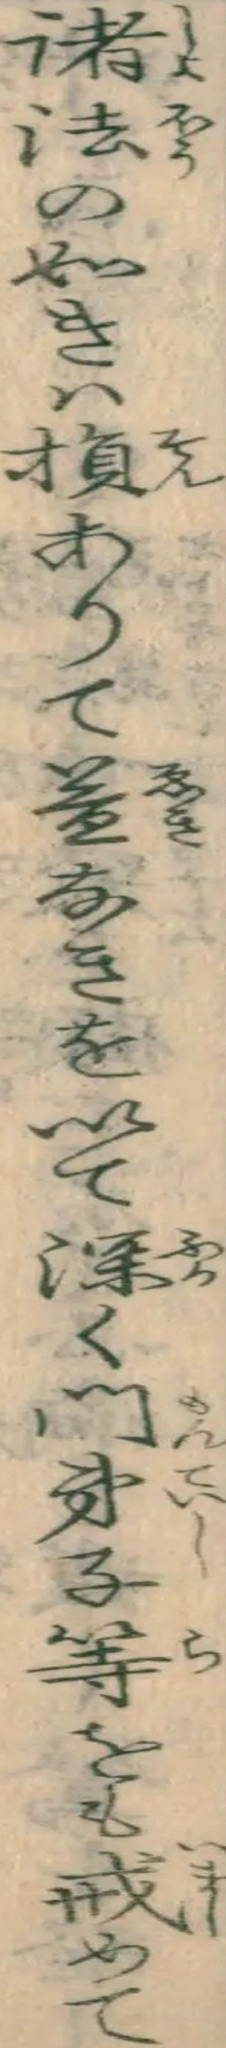諸法の如きは損ありて益なきを以て深く門弟子等をも戒めて
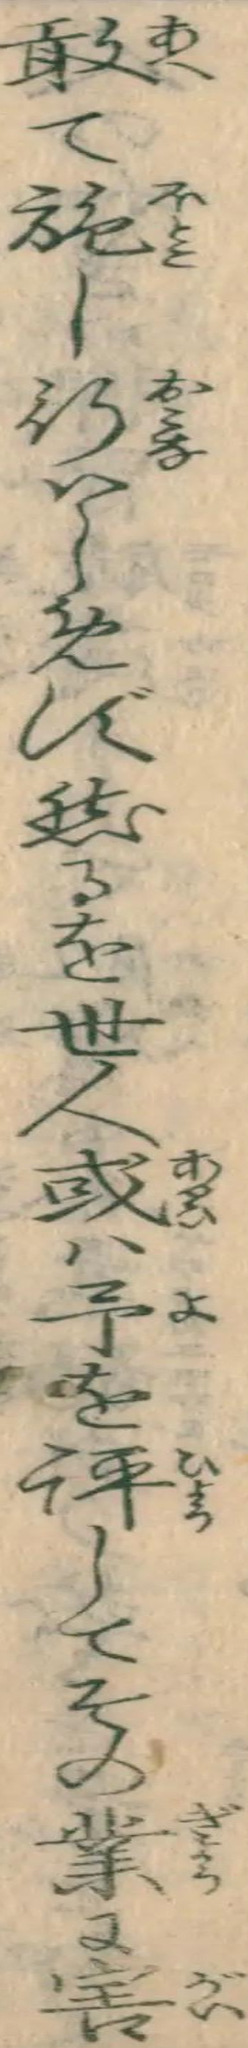敢て施し行いしめず然るを世人或は予を評してその業に害
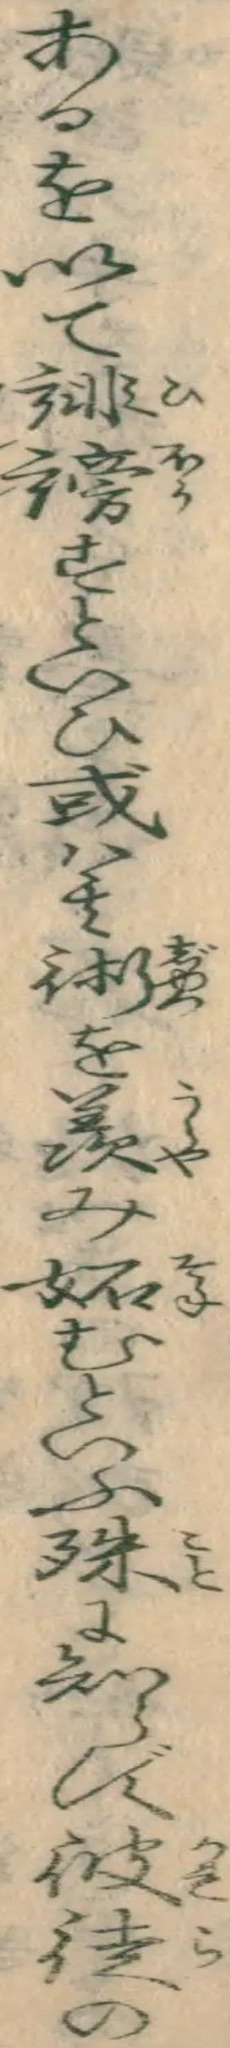あるを以て誹謗すといひ或は其術を羨み妬むといふ殊に知らず彼徒の
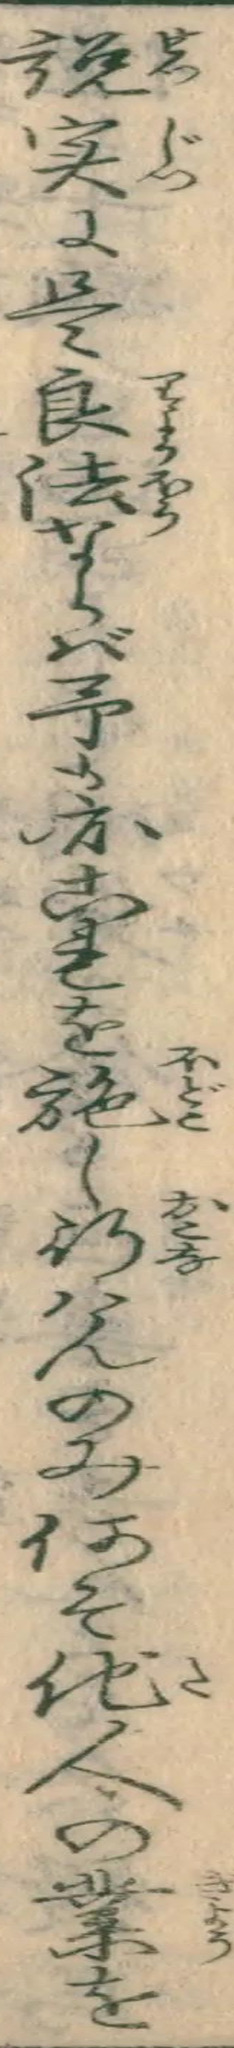説実に是良法ならば予に亦これを施し行はんのみ何そ他人の業を
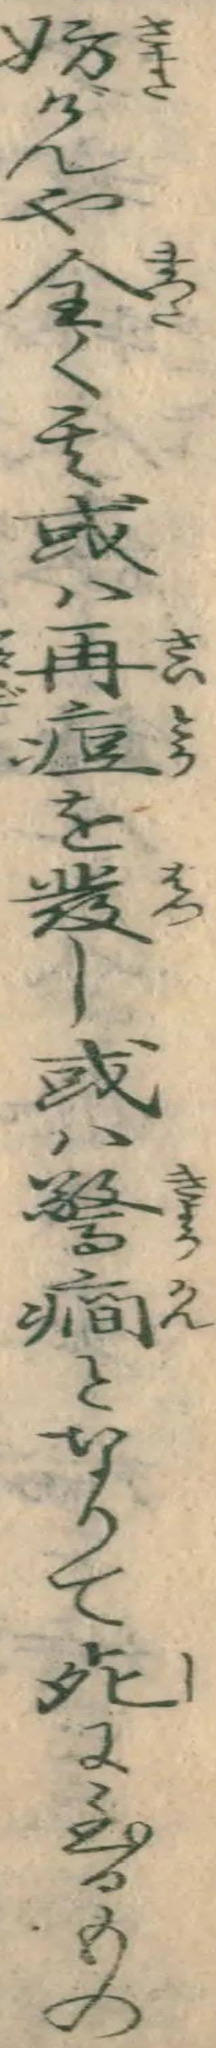防げんや全く其或は再痘を發し或は驚癇となりて死ぬに至るもの
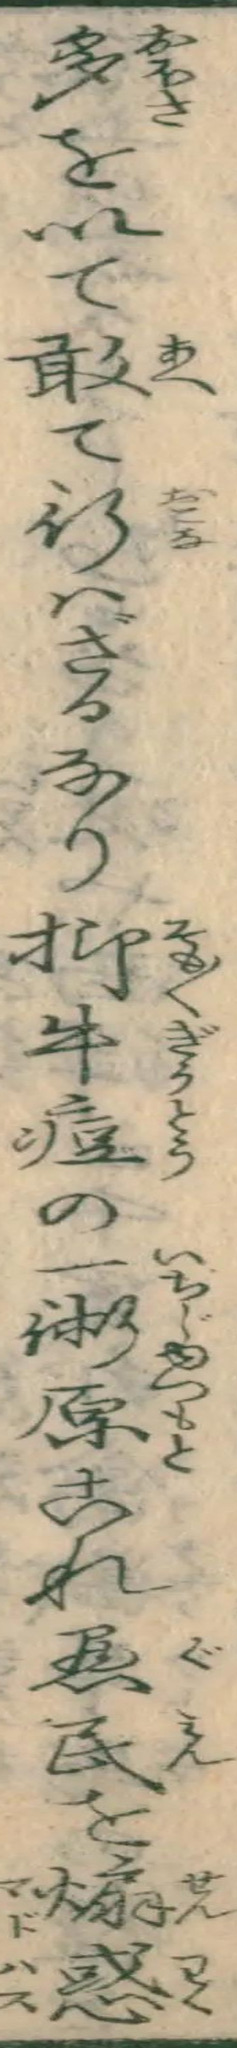多を以て敢て行はざるなり抑牛痘の一術原これ愚民を煽惑
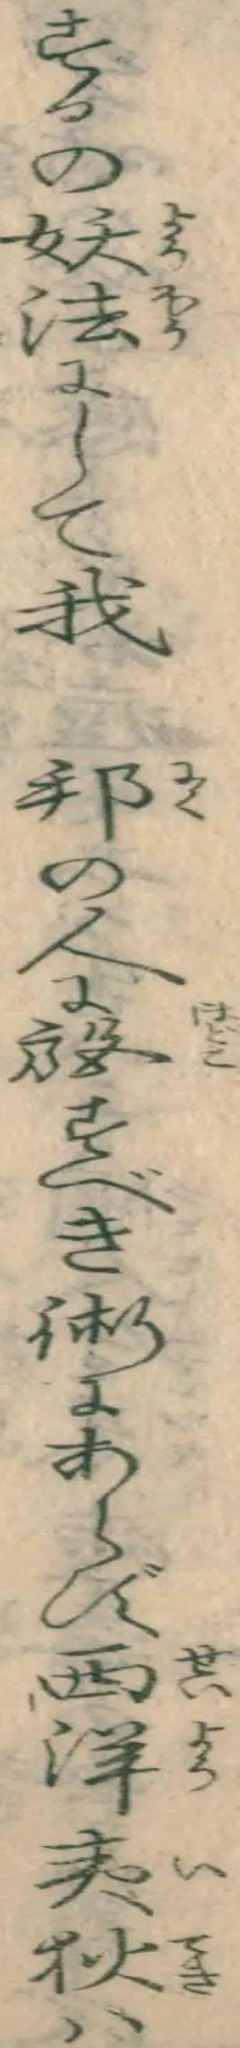するの妖法にして我邦の人に施すべき術にあらず西洋夷狄は
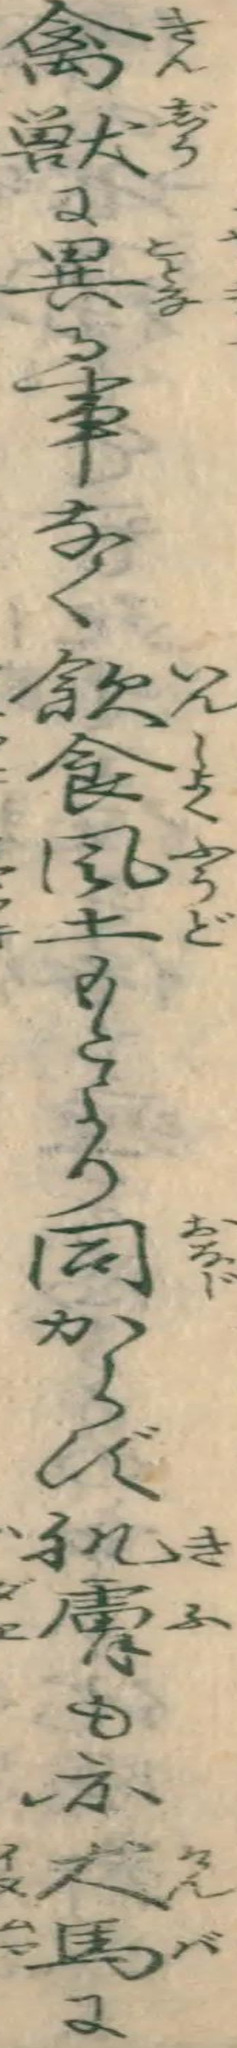禽獣に異る事なく飲食風土もとより同からず肌膚も亦犬馬に
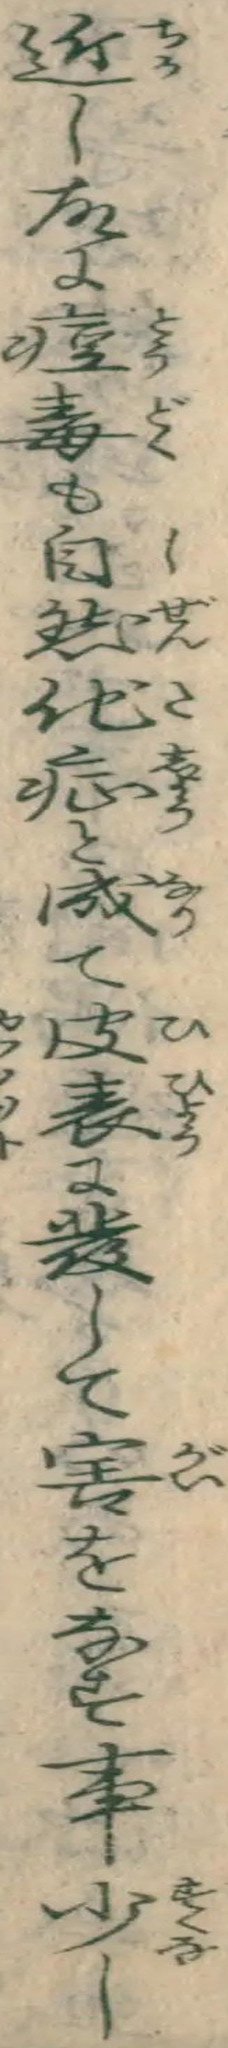近し故に痘毒も自然他症と成て皮表に発して害をなす事少し
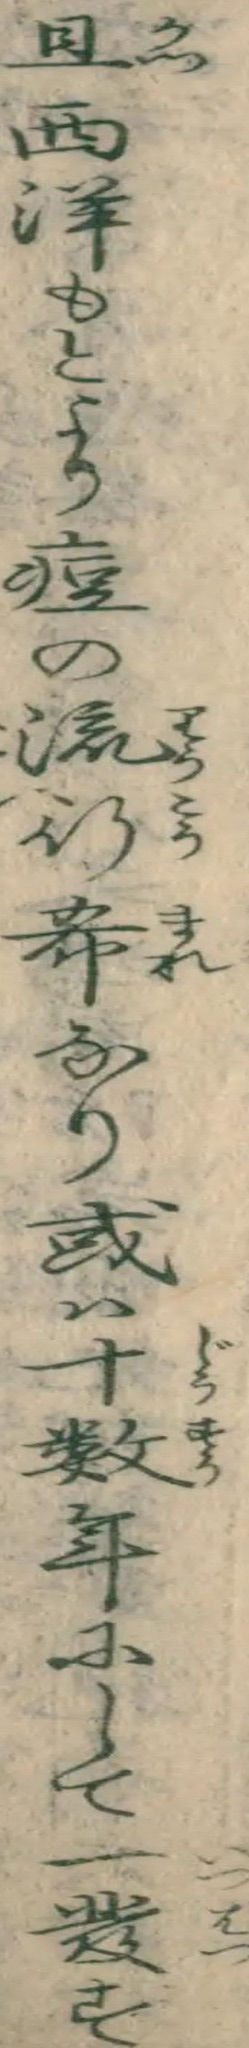且西洋もとより痘の流行稀なり或は十数年にして一発す

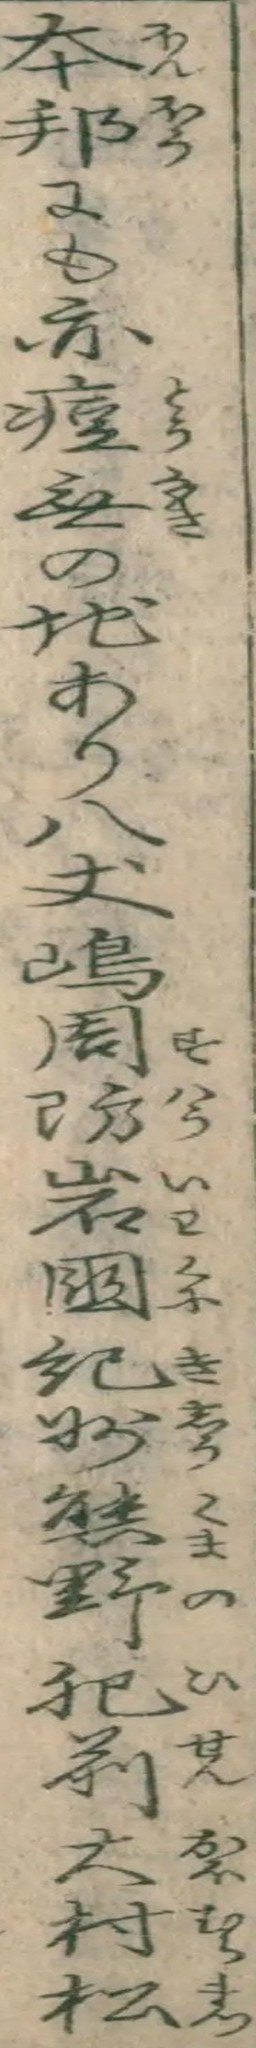本邦にも亦痘無の地あり八丈島周防岩国紀州熊野肥前大村松
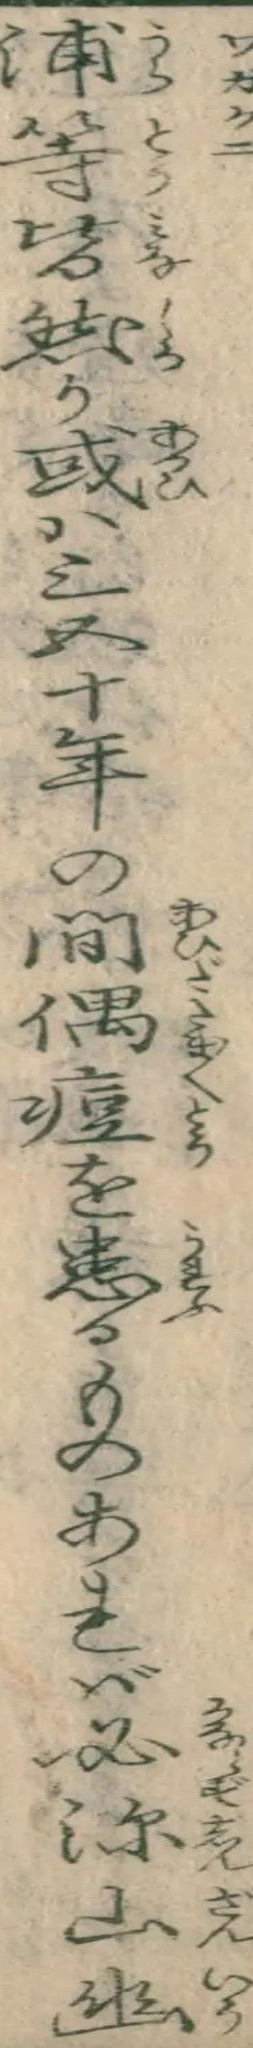浦等皆然り或は三五十年の間偶痘を患るものあれば必深山幽
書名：牛痘辨非
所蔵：国立国会図書館 National Diet Library, JAPAN
